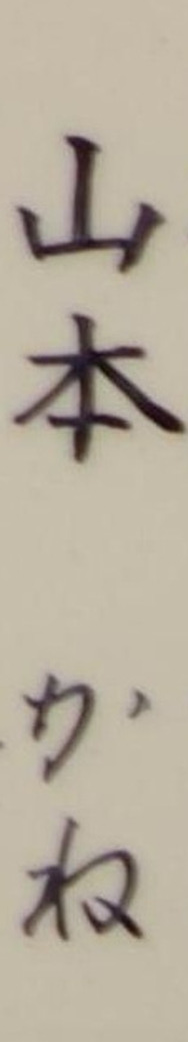山本かね
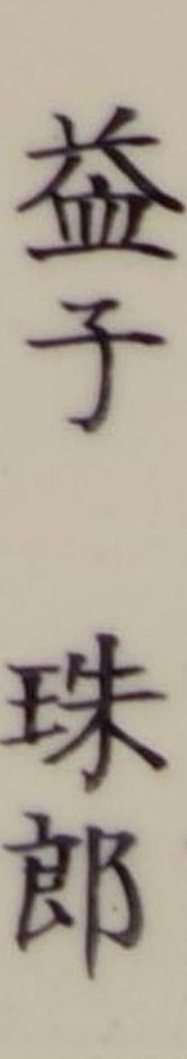益子珠郎
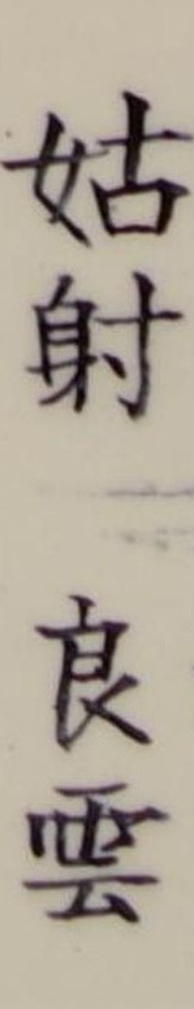姑射良雲
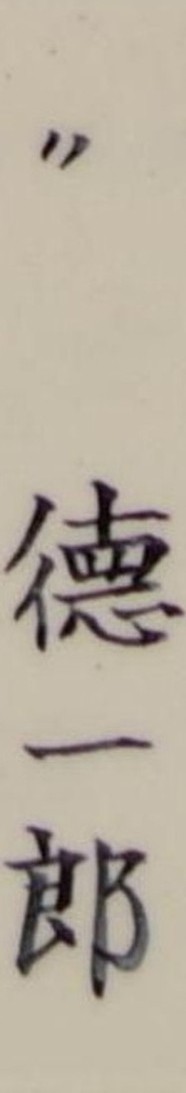徳一郎
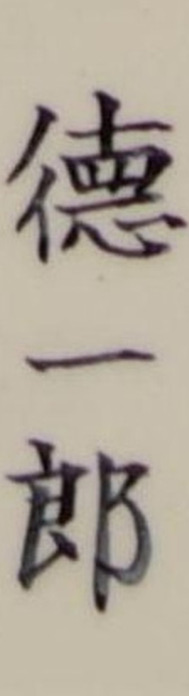徳一郎
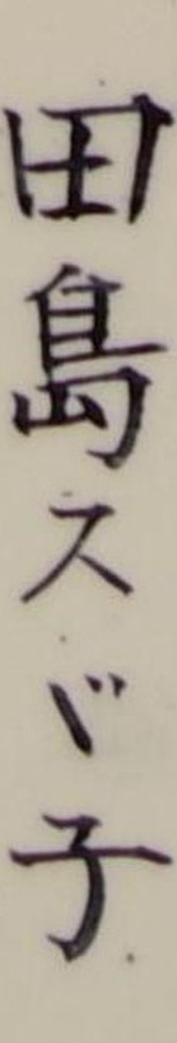田島スヾ子
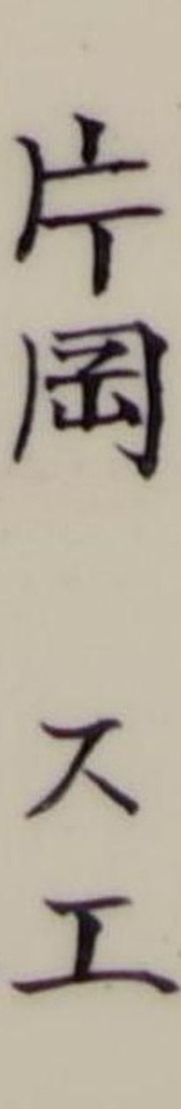片岡ス工
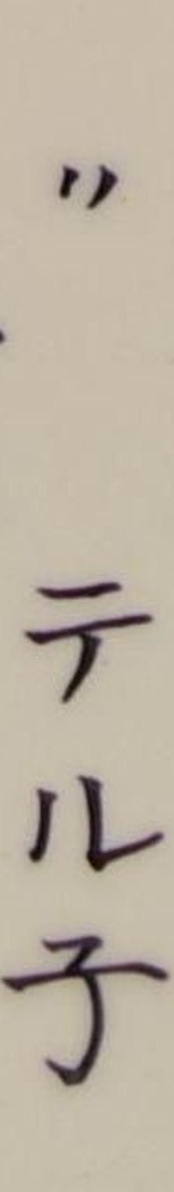テル子
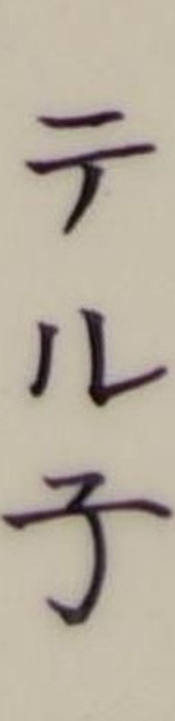テル子
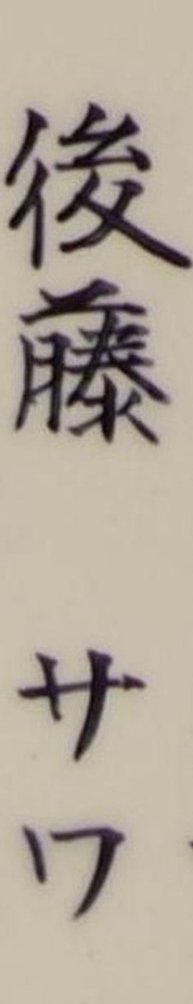後藤サワ
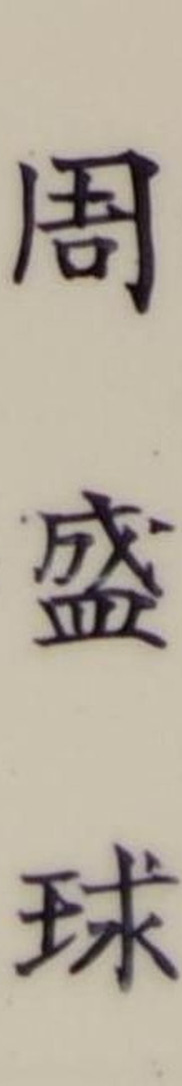周盛珠
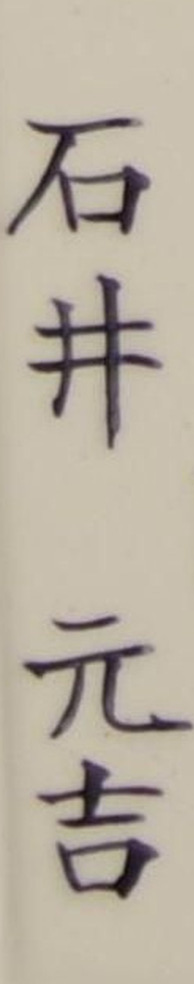石井元吉

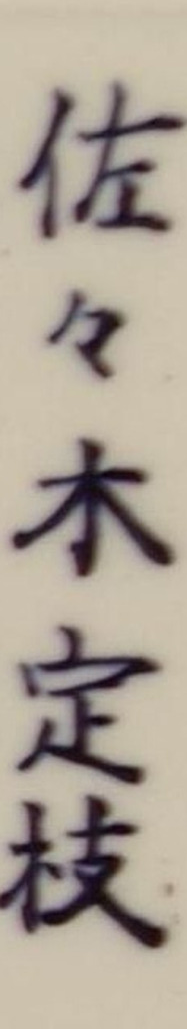佐々木定枝
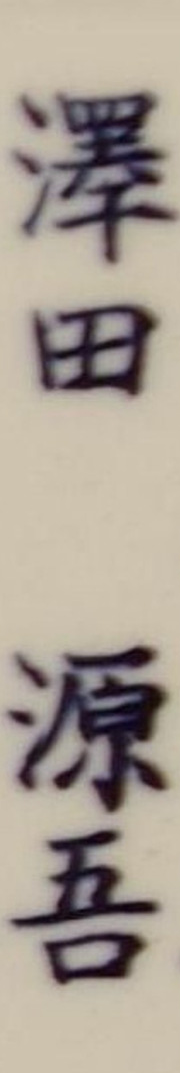澤田源吾
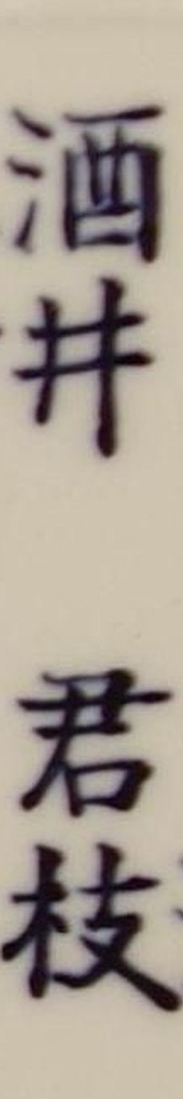酒井君枝
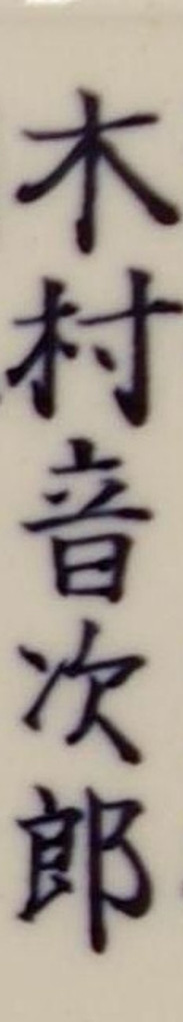木村音次郎
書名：M~S
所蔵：高野山金剛峯寺
